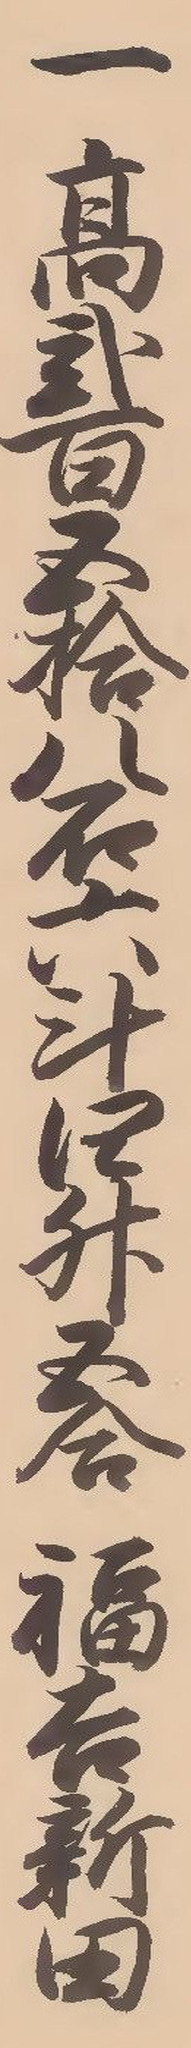一髙弐百五拾八石六斗四升五合福吉新田
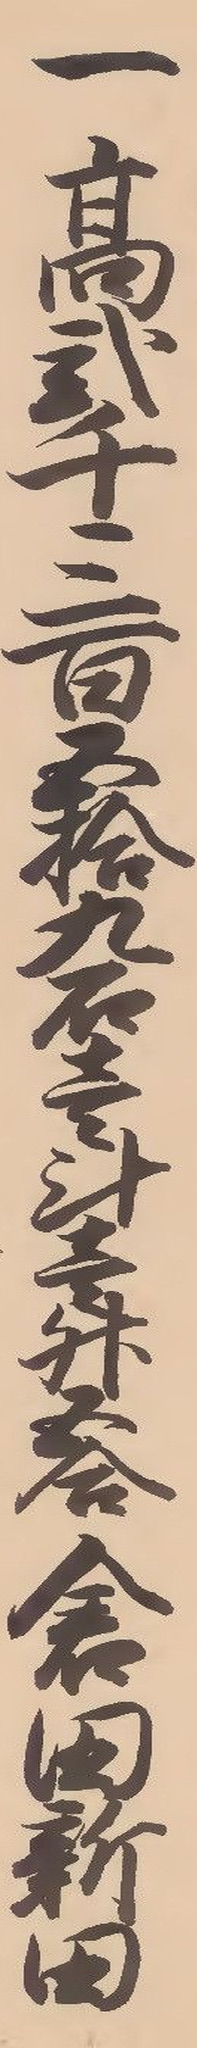一髙千三百五拾九石壱斗壱升五合倉田新田
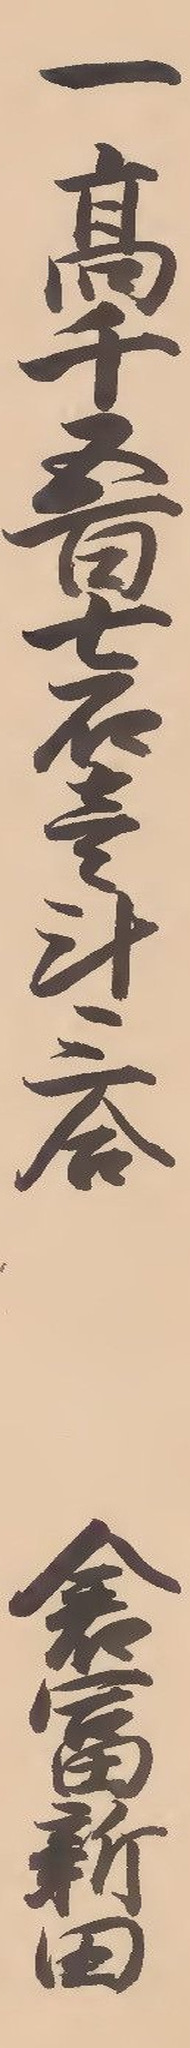一髙千五百七石壱斗三合倉冨新田
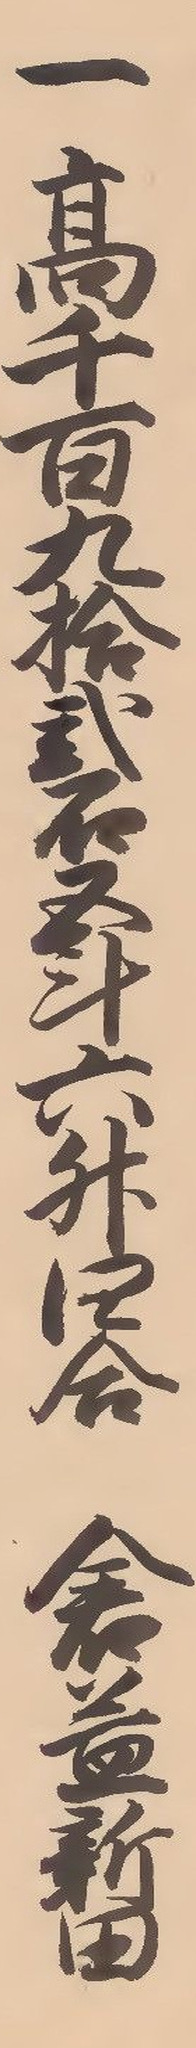一髙千百九拾弐石五斗六升四合倉益新田
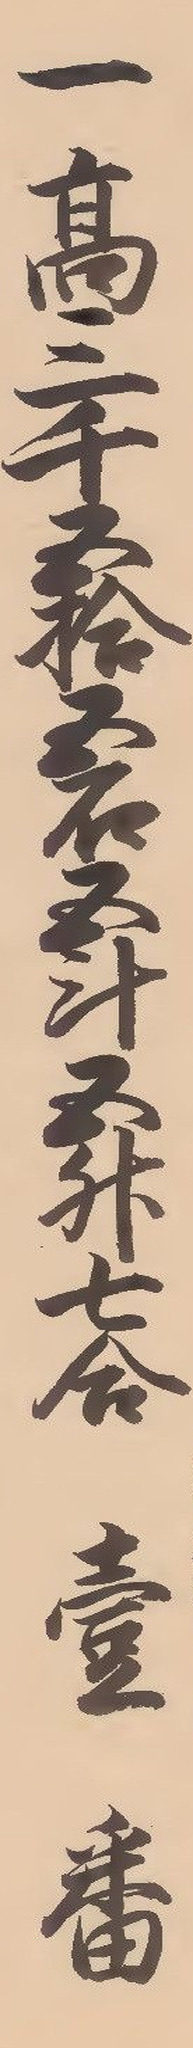一髙三千五拾五石五斗五升七合壱番
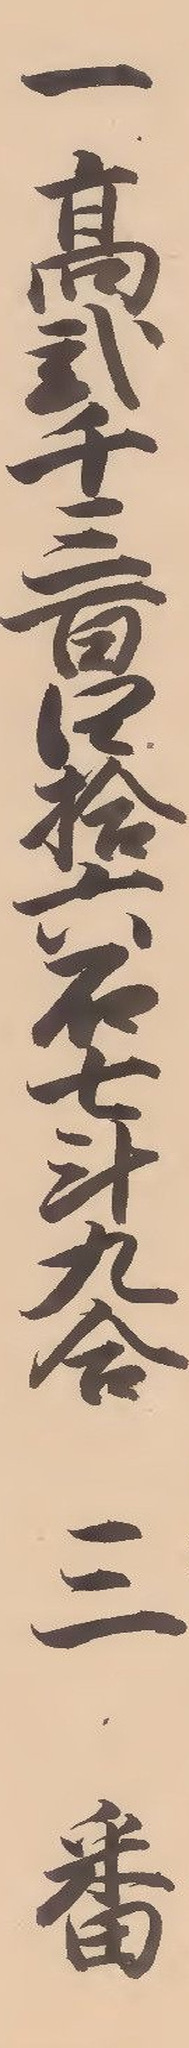一髙弐千三百四拾六石七斗九合三番
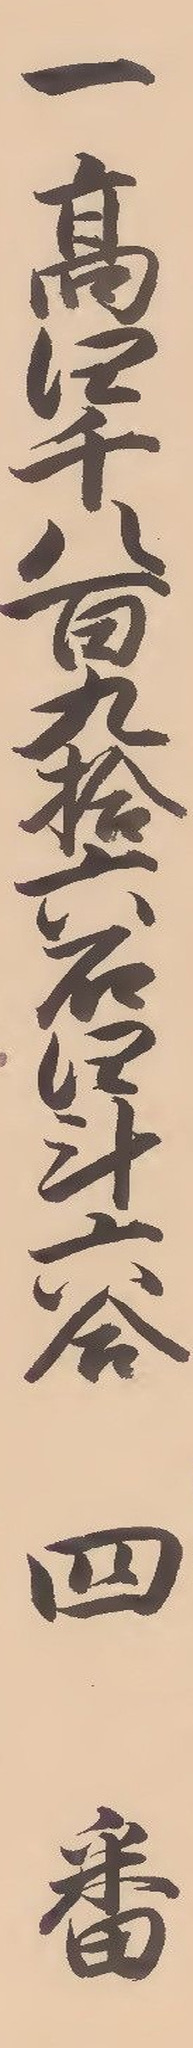一髙四千八百九拾六石四斗六合四番

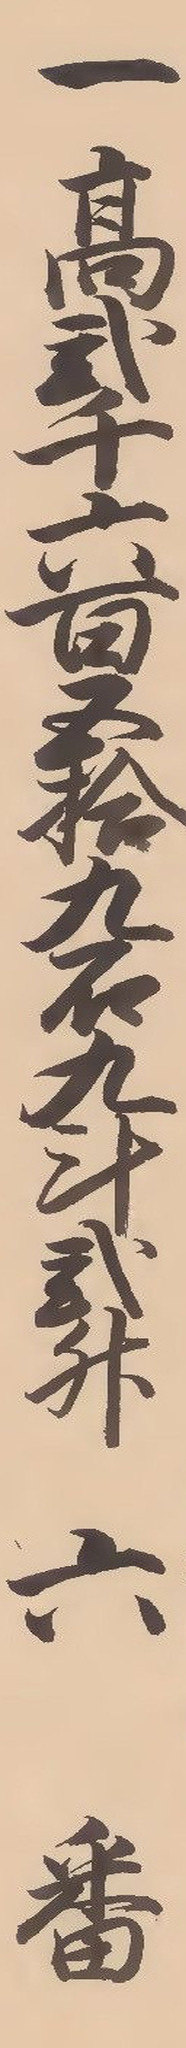一髙弐千六百五拾九石九斗弐升六番
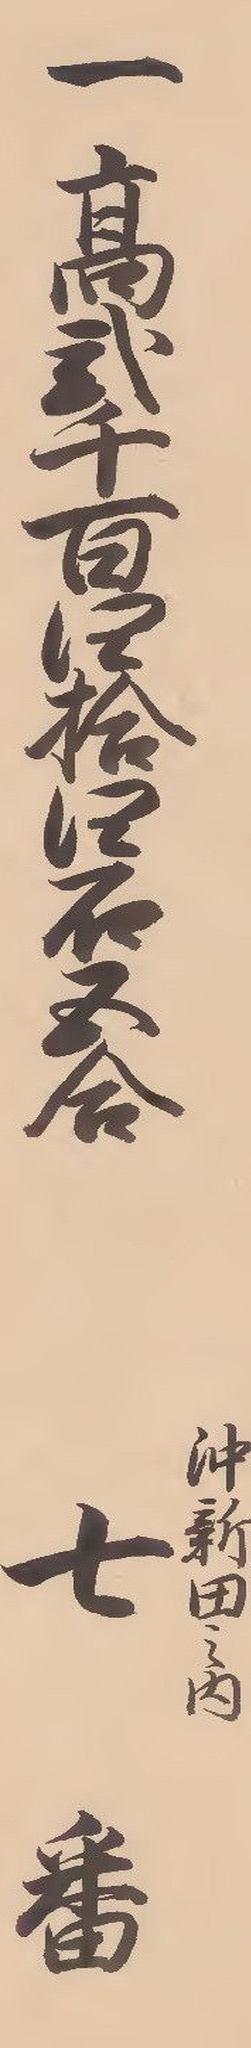一髙弐千百四拾四石五合七番
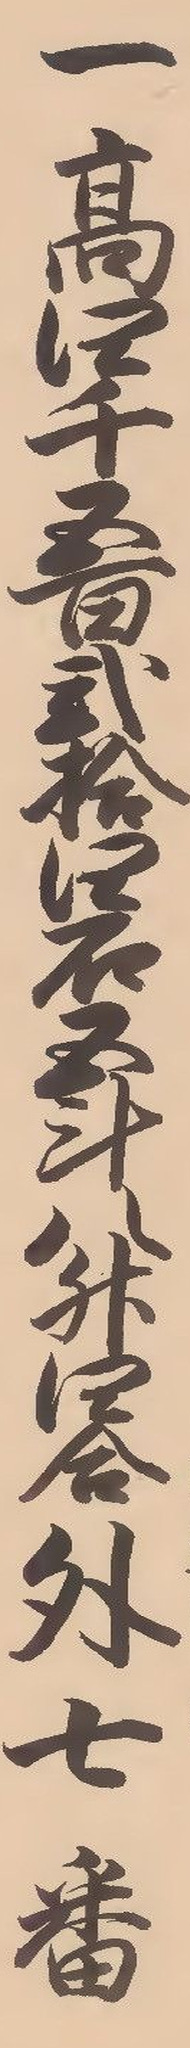一髙四千五百弐拾四石五斗八升四合外七番
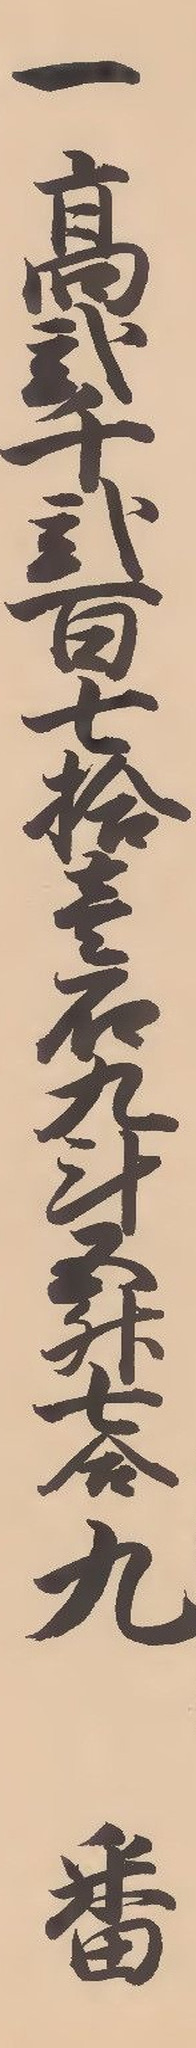一髙弐千弐百七拾壱石九斗五升七合九番
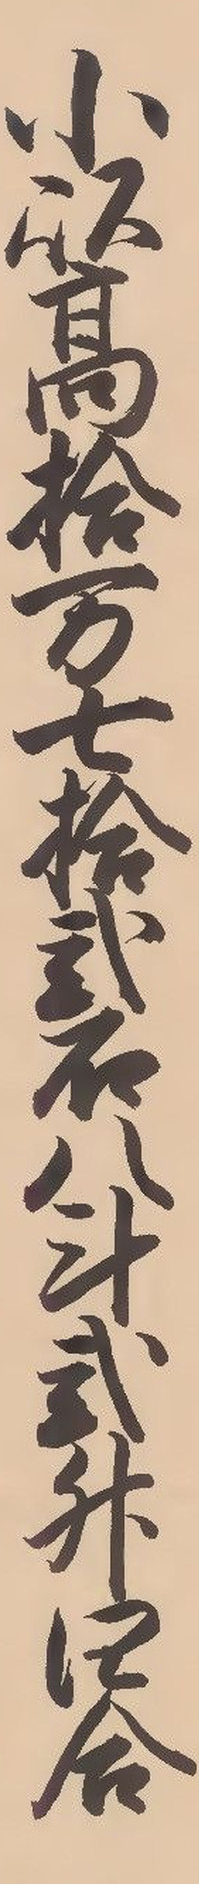小以髙拾万七拾弐石八斗弐升四合

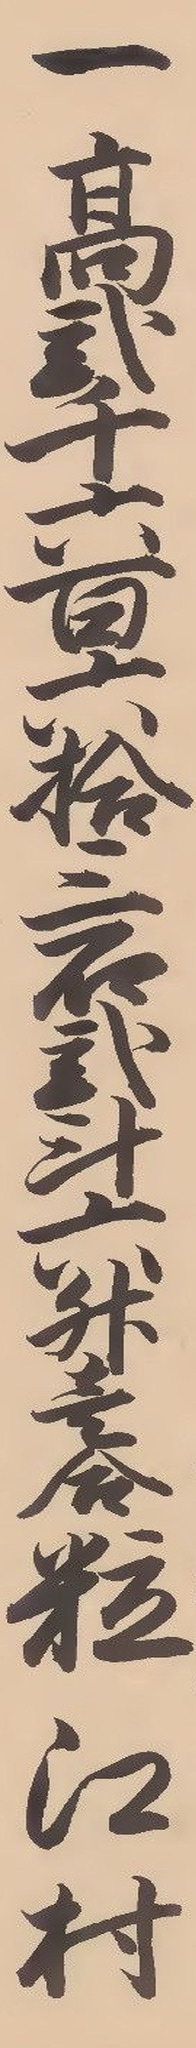一髙弐千六百六拾三石弐斗六升壱合粒江村
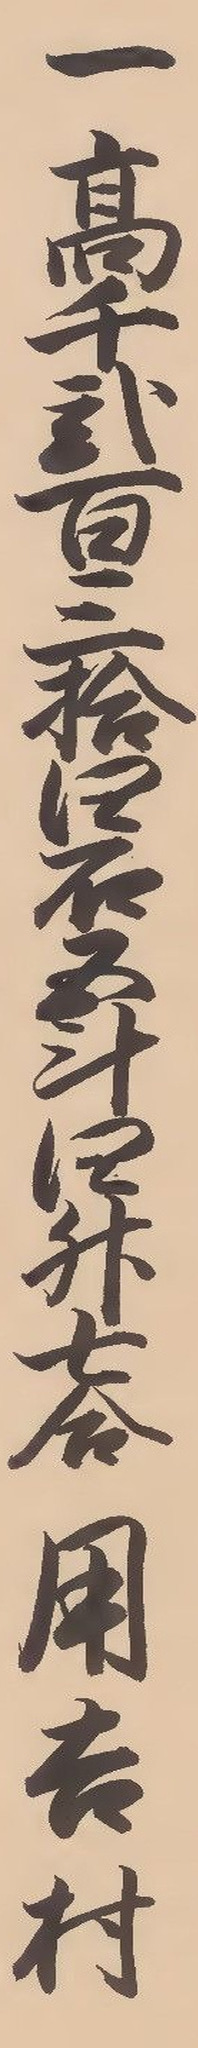一髙千弐百三拾四石五斗四升七合用吉村
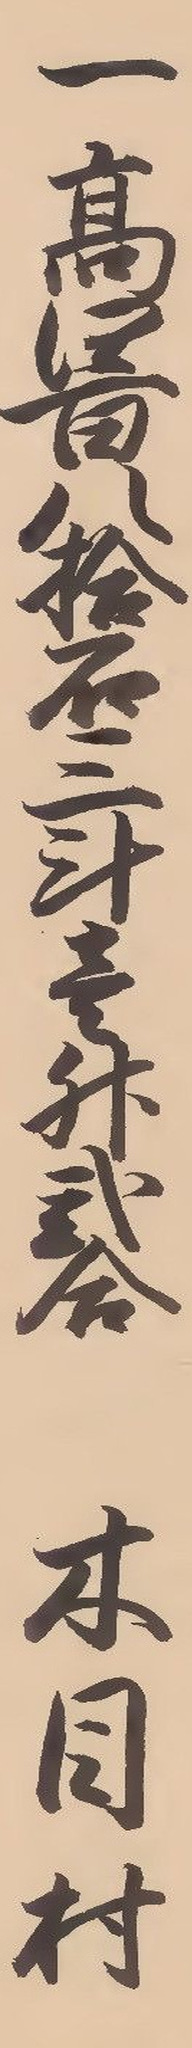一髙四百八拾石三斗壱升弐合木目村
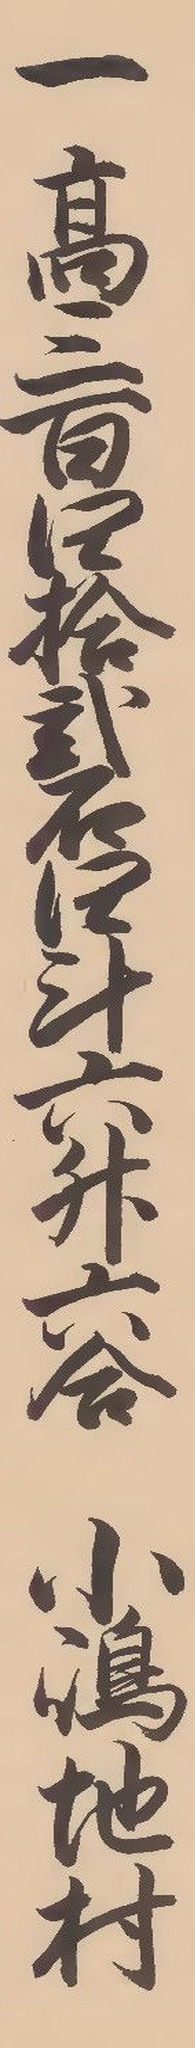一髙三百四拾弐石四斗六升六合小嶋地村
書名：備前国郷帳
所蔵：国立公文書館 National Archives of Japan
